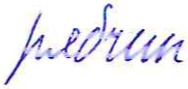рябчик
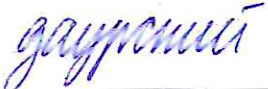даурский
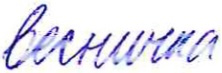весничка
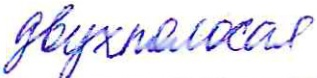двухполосая
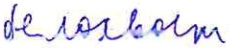белохвост
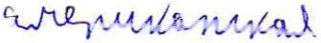американская
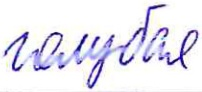голубая
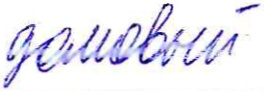домовый
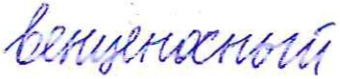венценосный
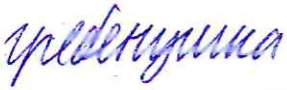гребенушка
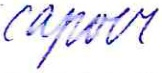сарыч
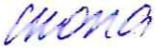скопа
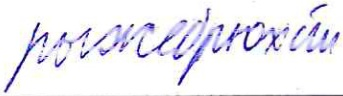рыжебрюхий
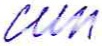сип
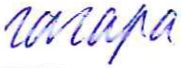гагара
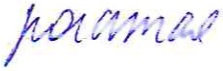рогатая
